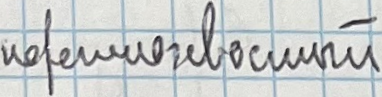короткохвостый
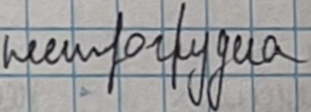пестрогрудка
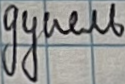дупель
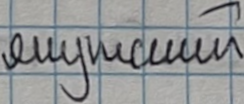якутский
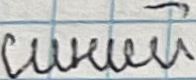синий
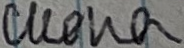скопа
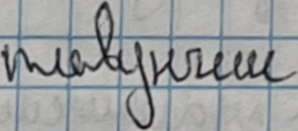плавунчик
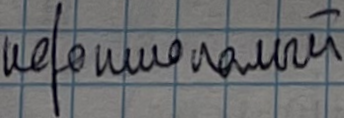короткопалый
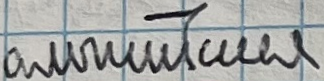альпийская
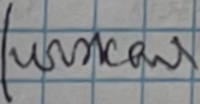рыжая
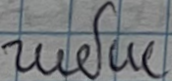чибис
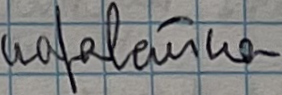каравайка
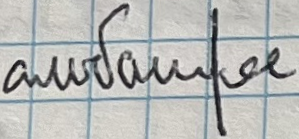альбатрос
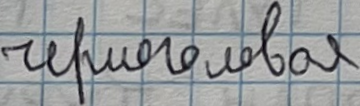черноголовая
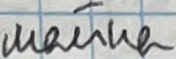майна
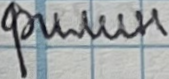филин
